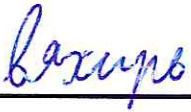вяхирь
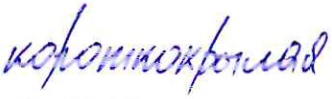короткокрылая
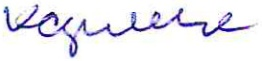карлил
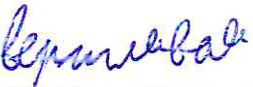вертлявая
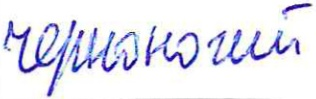черноногий
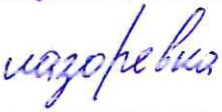лазоревка
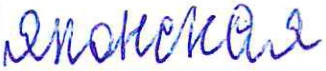японская
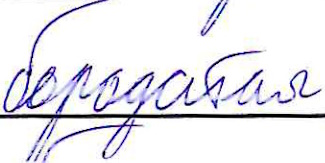бородатая
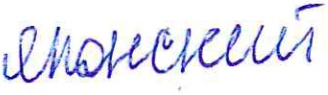японский
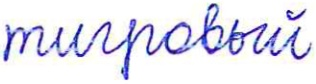тигровый
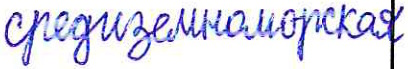средиземноморская
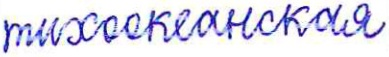тихоокеанская
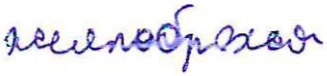желпоброхая
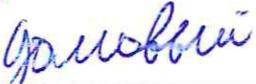домовый
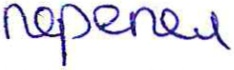перепел
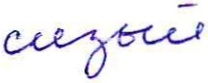сизый
